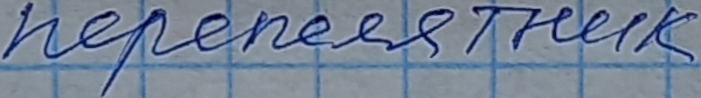перепелятник
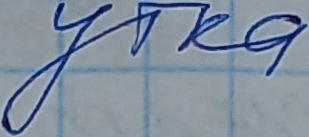утка
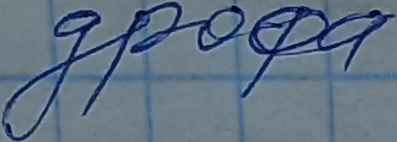дрофа
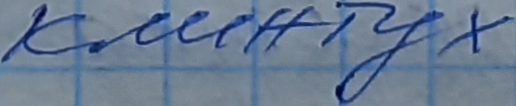клинтух
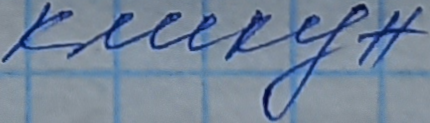кликун
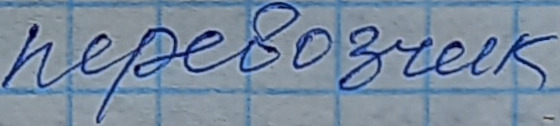перевозчик
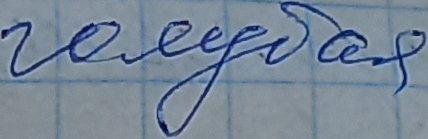голубая
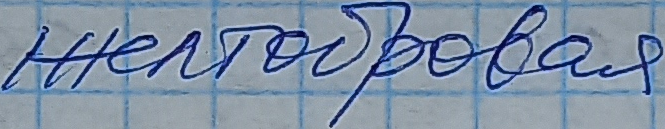желтобровая
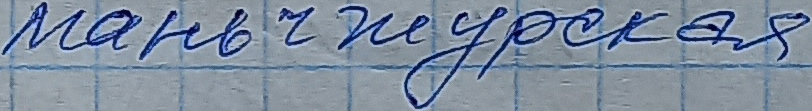маньчжурская
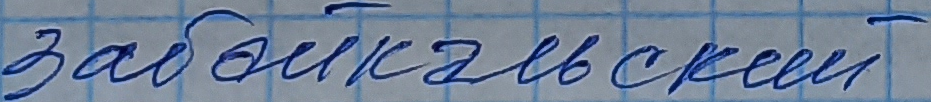забайкальский
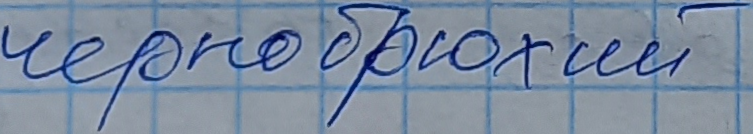чернобрюхий
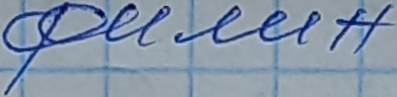филин
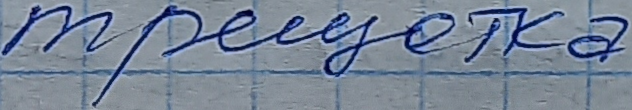трещотка
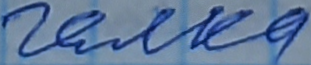галка
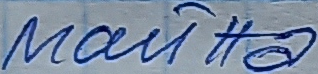майна
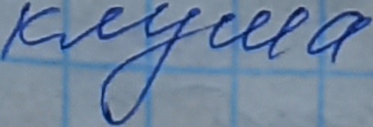клуша
